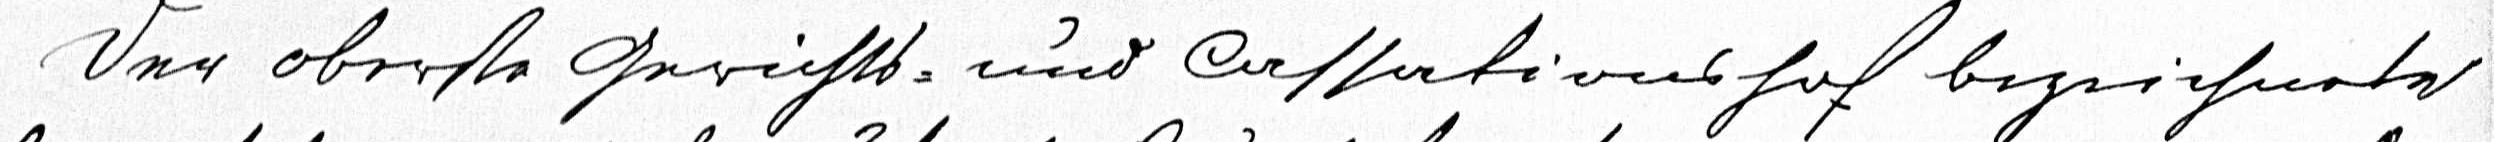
Der oberste Gerichts- und Cassationshof bezeichnete
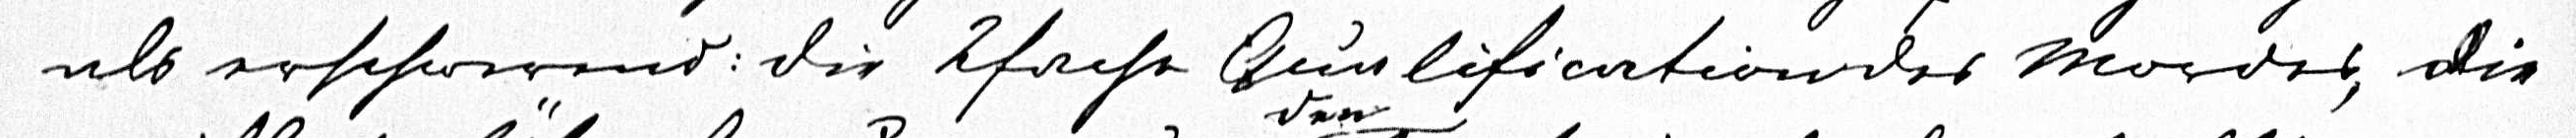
als erschweren: die 2fache Qualification des Mordes, die
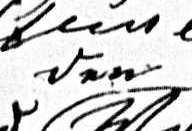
den
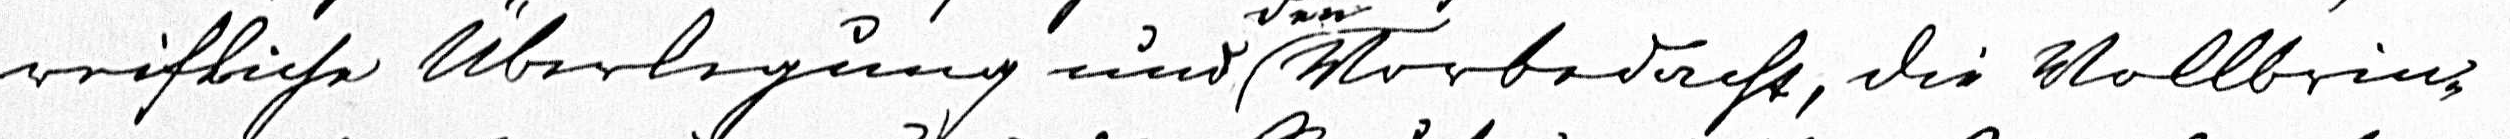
reifliche Überlegung und Vorbedacht, die Vollbrin¬
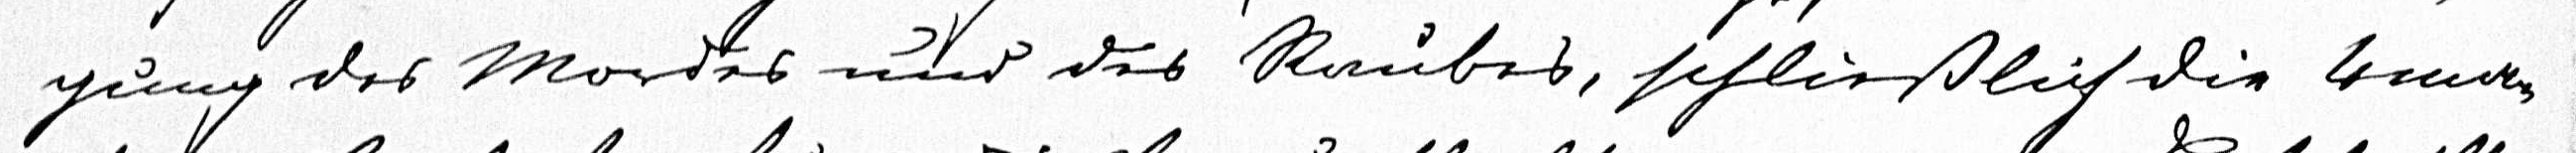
gung des Mordes und des Raubes, schließlich die 4ma¬
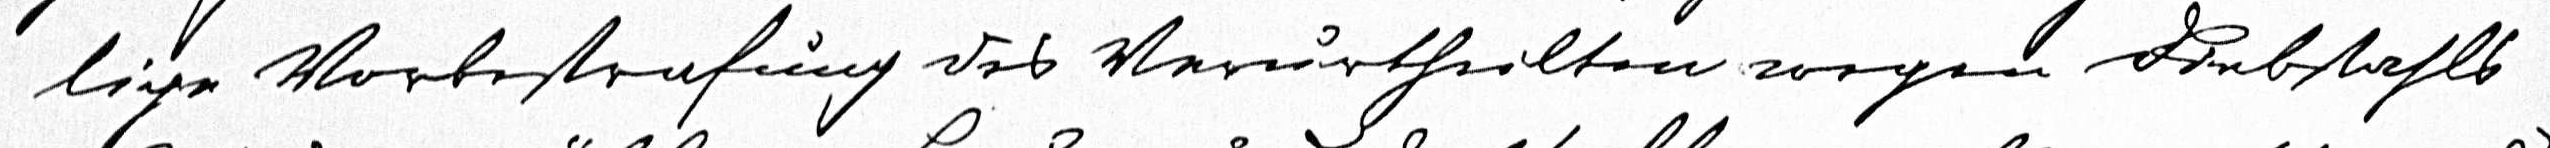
lige Vorbestrafung des Verurtheilten wegen Diebstahls
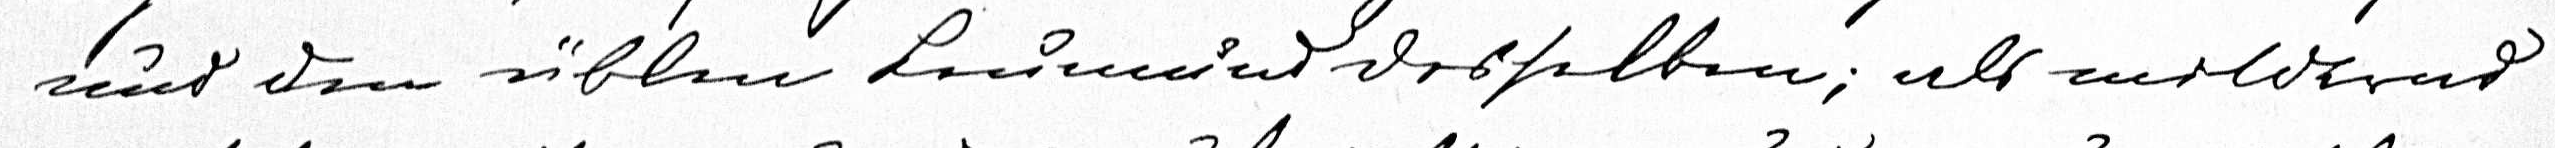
und den üblen Leumund desselben; als mildernd
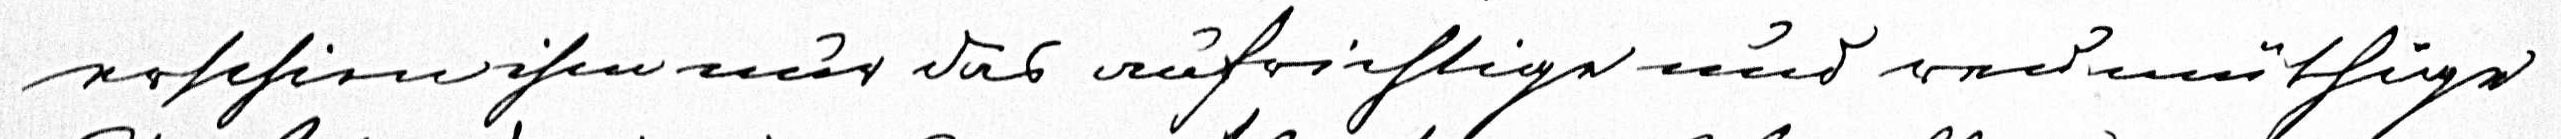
erschien ihm nur das aufrichtige und reumüthige
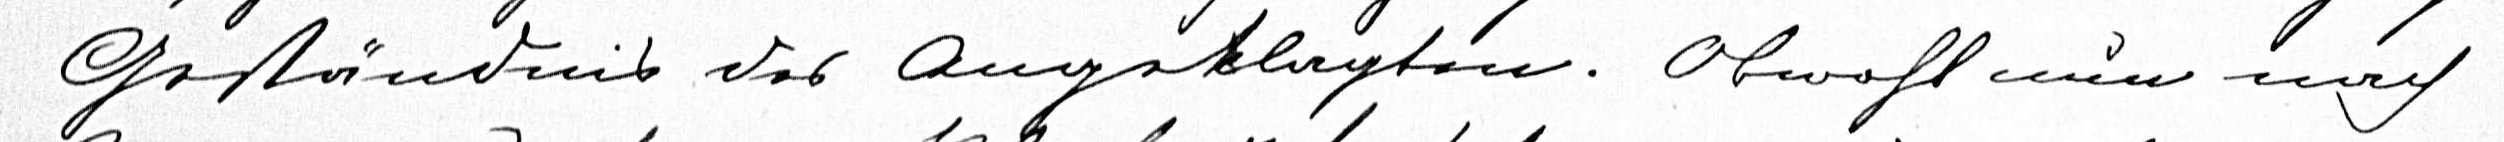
Geständnis des Angeklagten. Obwohl nun nach
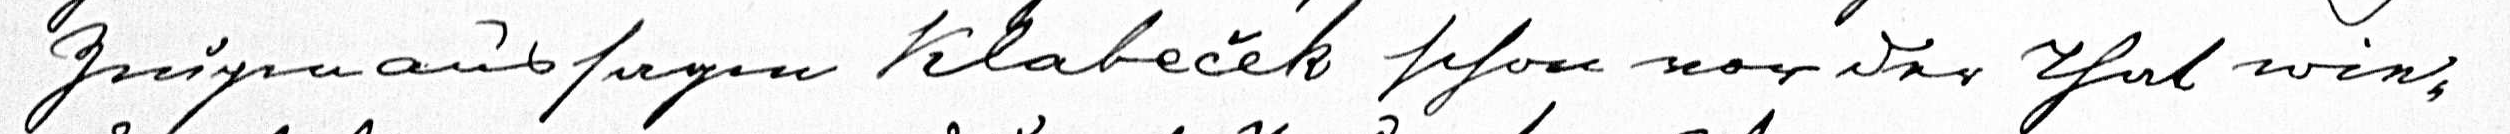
Zeugenaussagen Klabeček schon vor der That wie¬
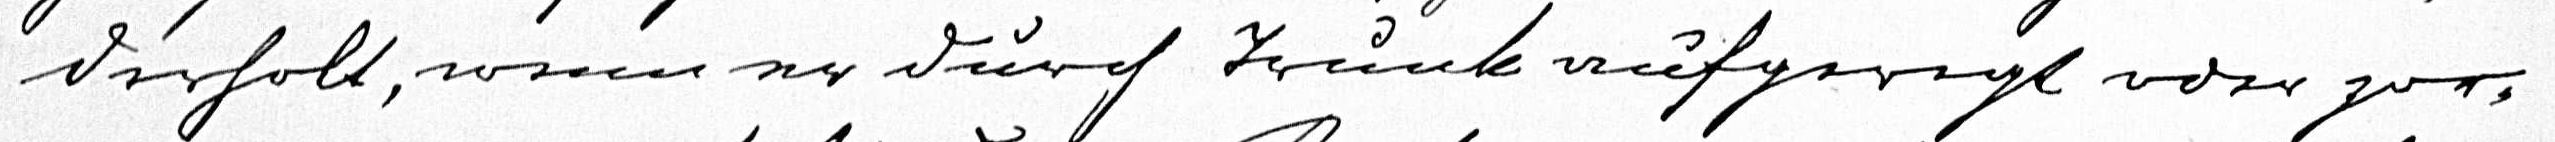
derholt, wenn er durch Trunk aufgeregt war zor¬
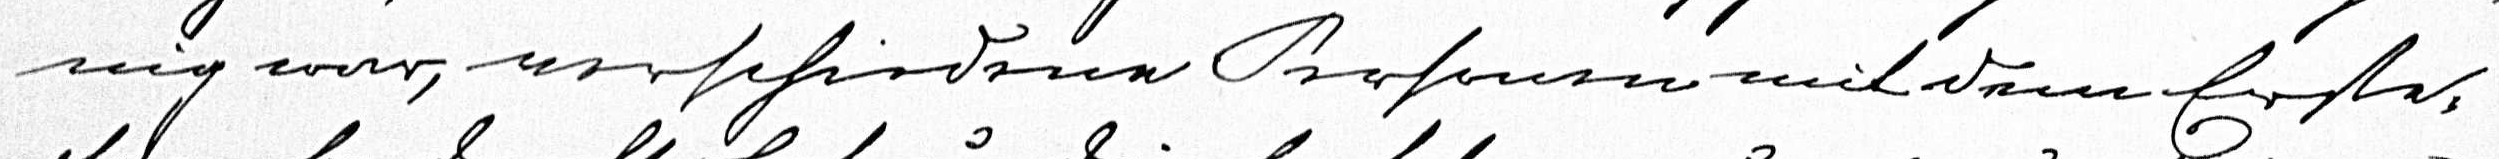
nig war, verschiedene Personen mit dem Erste¬
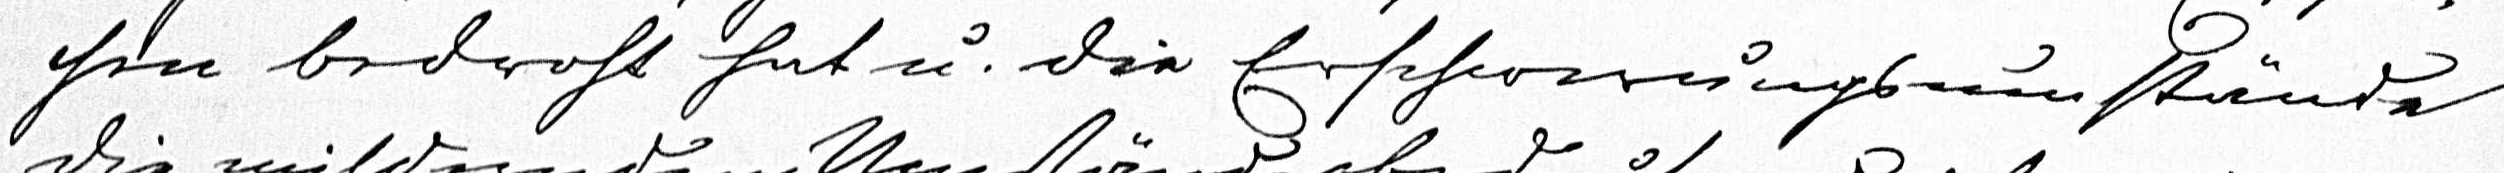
chen bedroht hat u. die Erschwerungsumstände
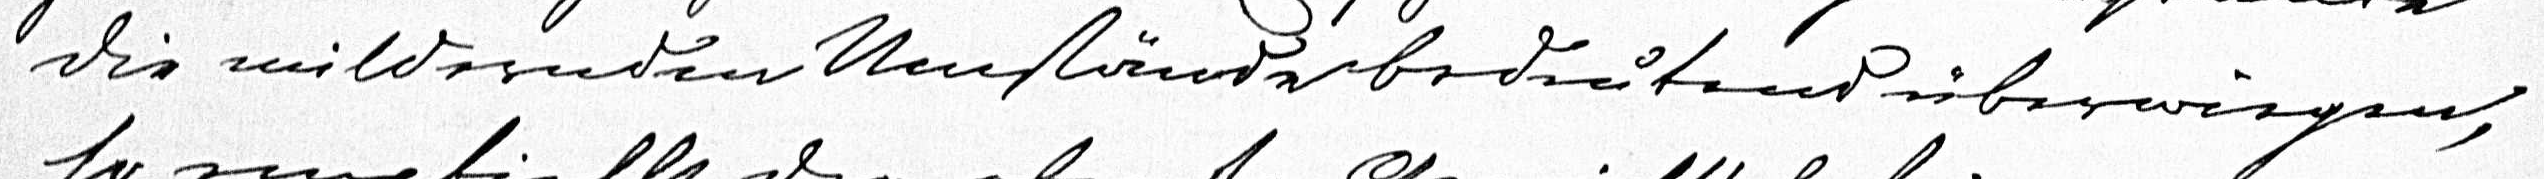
die mildernden Umstände bedeutend überwiegen,
